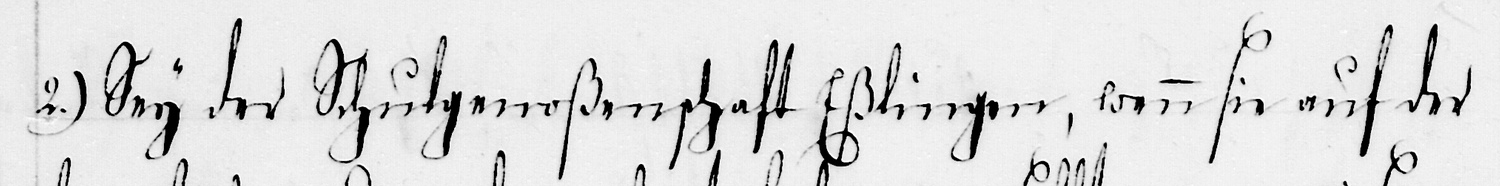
2.) Sey der Schulgenoßenschaft Eßlingen, wenn sie auf der
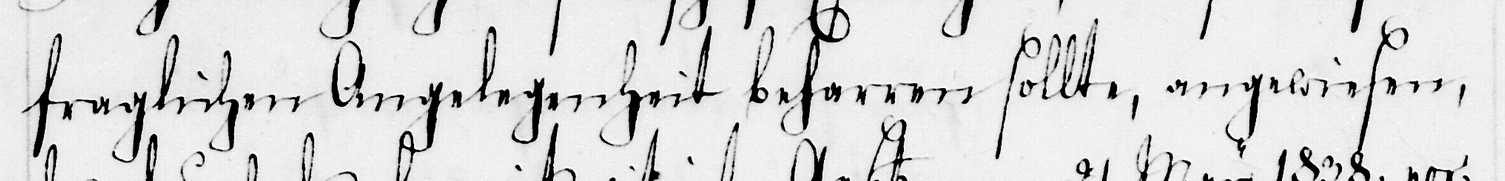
fraglichen Angelegenheit beharren sollte, angewiesen,
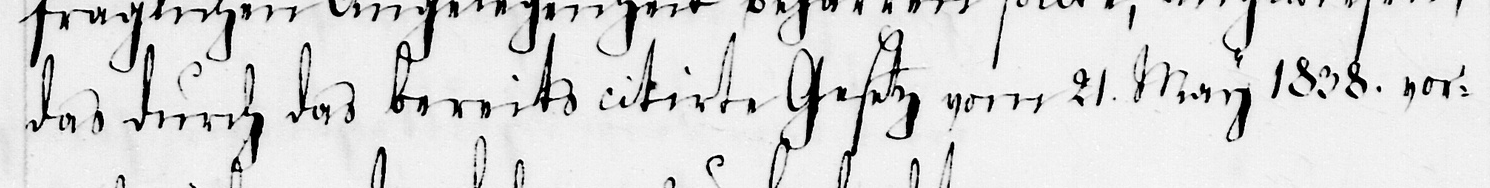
das durch das bereits citirte Gesetz vom 21. März 1838. vor¬
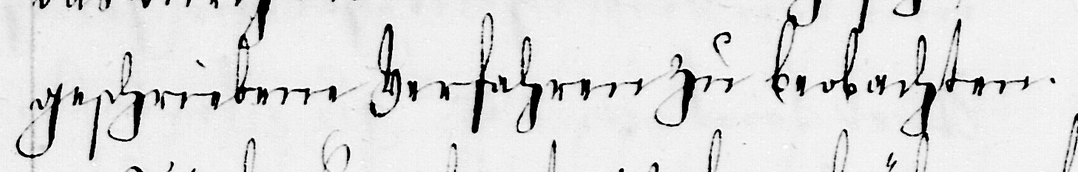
geschriebene Verfahren zu beobachten.
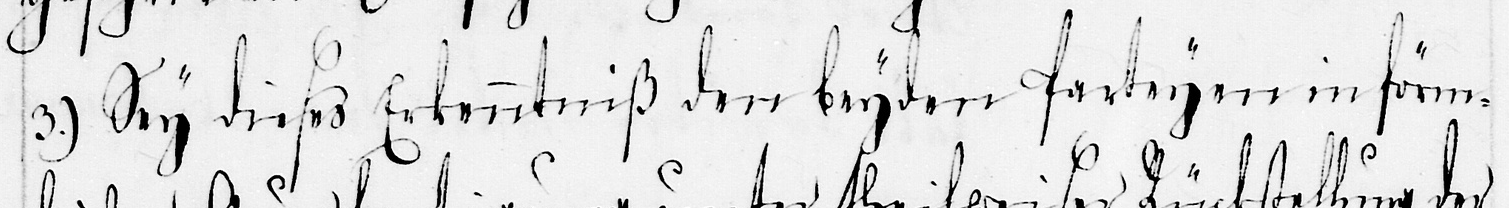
3.) Sey dieses Erkenntniß den beyden Parteyen in förm¬
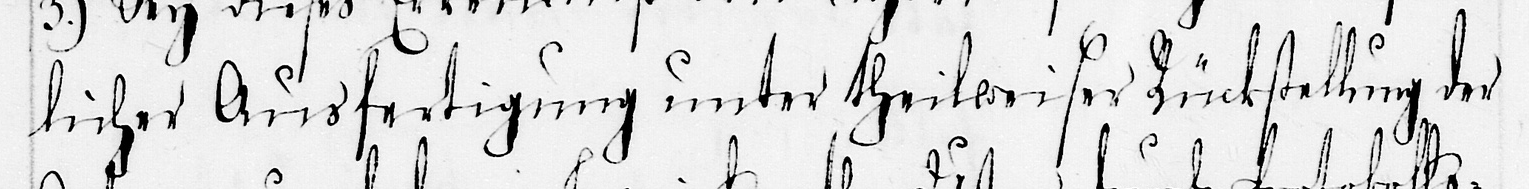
licher Ausfertigung unter theilweiser Rückstellung der
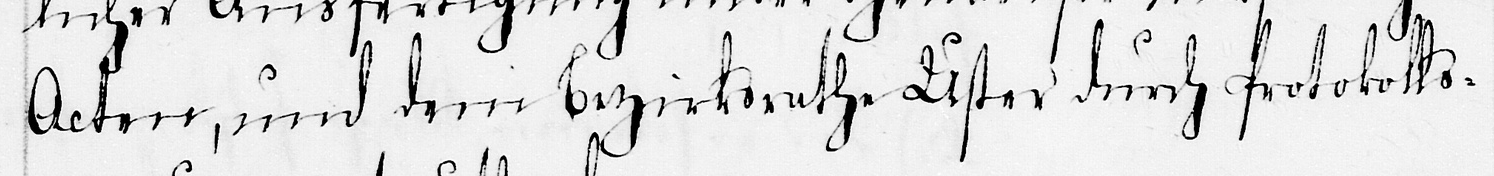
Acten, und dem Bezirksrathe Uster durch Protokolls¬
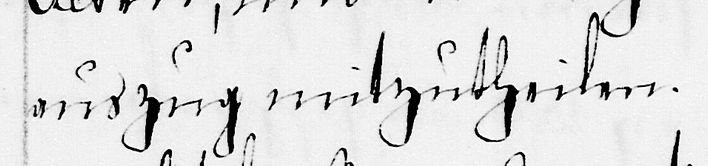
auszug mitzutheilen.
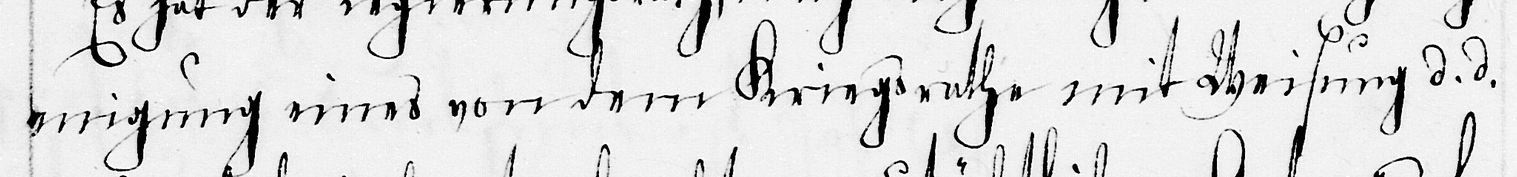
migung eines von dem Kriegsrathe mit Weisung d. d.
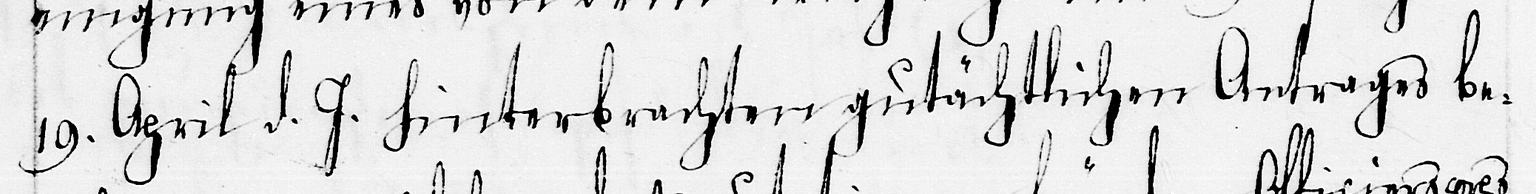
19. April d. J. hinterbrachten gutächtlichen Antrages be¬
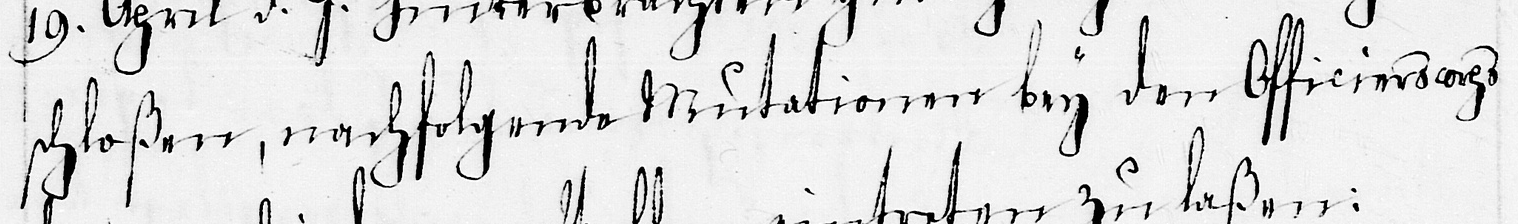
schloßen, nachfolgende Mutationen bey den Officierscor¬
